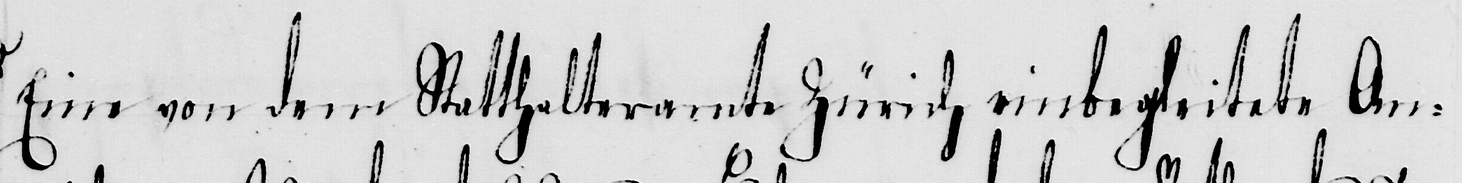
eine von dem Statthalteramte Zürich einbegleitete An¬
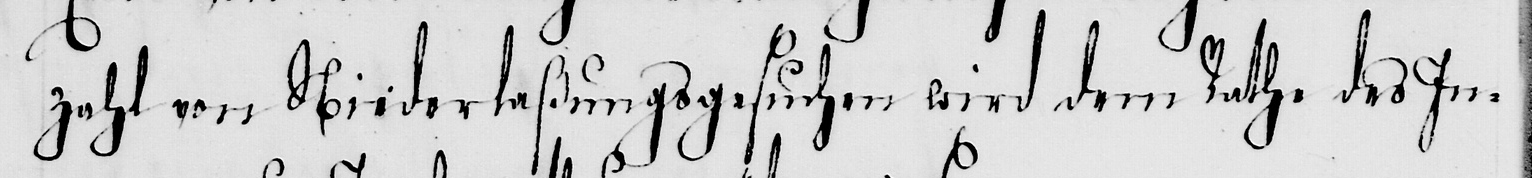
zahl von Niederlaßungsgesuchen wird dem Rathe des In¬
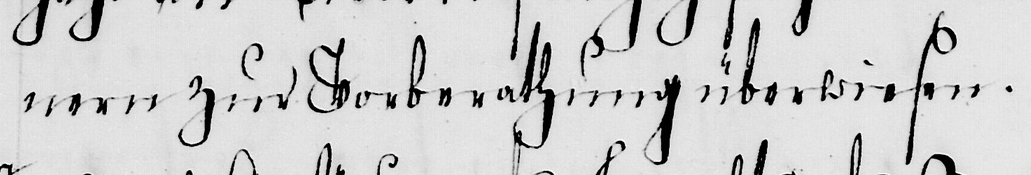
nern zur Vorberathung überwiesen.
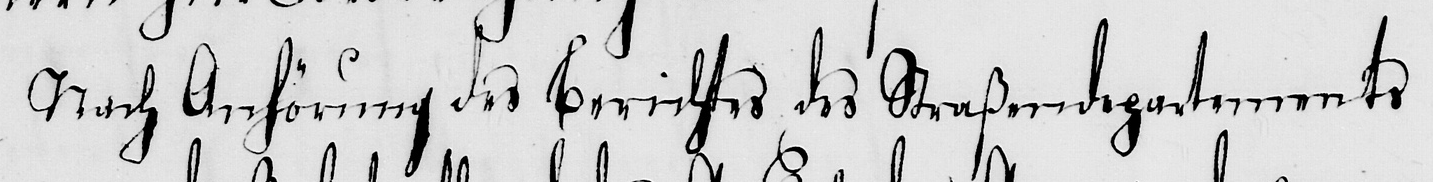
Nach Anhörung des Berichtes des Straßendepartementes
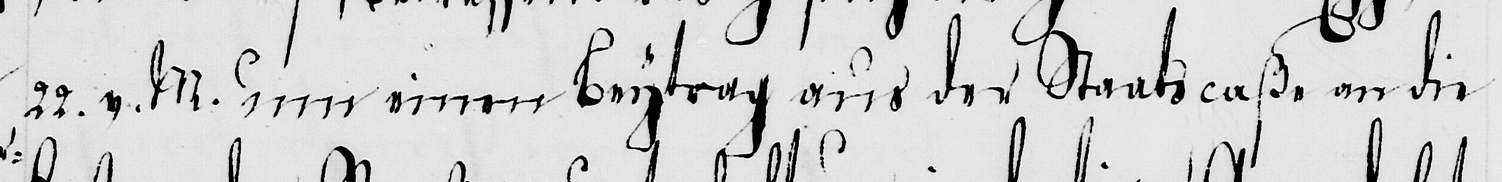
22. v. M. um einen Beytrag aus der Staatscaßa an die
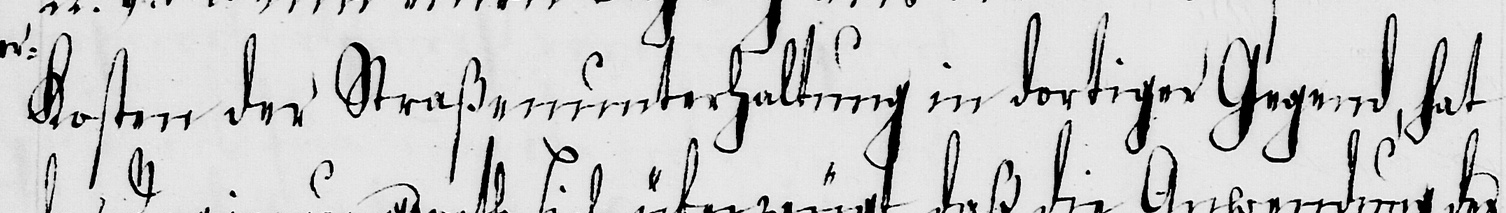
Kosten der Straßenunterhaltung in dortiger Gegend, hat
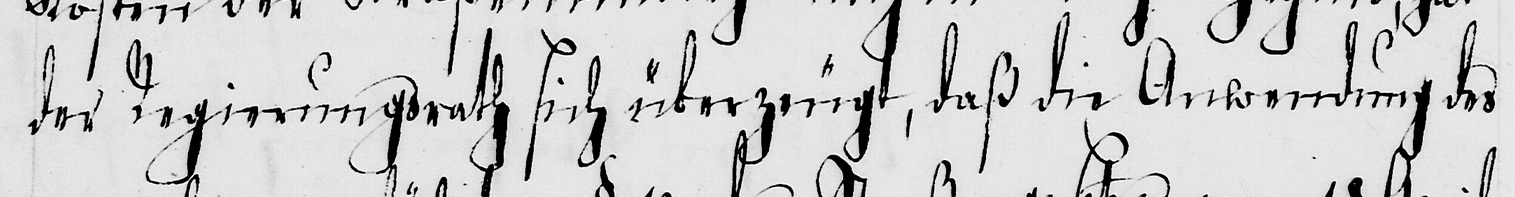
der Regierungsrath sich überzeugt, daß die Anwendung des
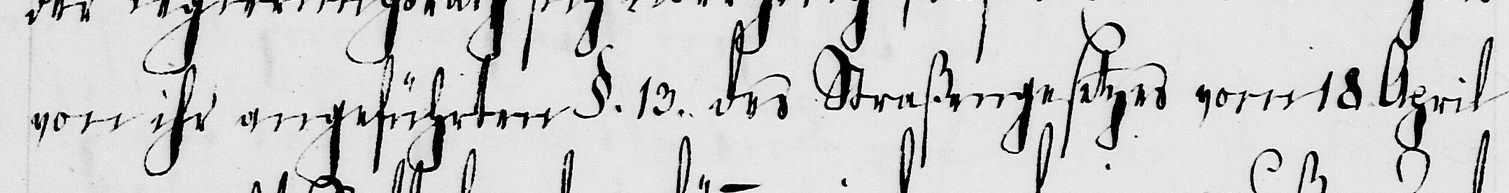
von ihr angeführten §. 13. des Straßengesetzes vom 18. April
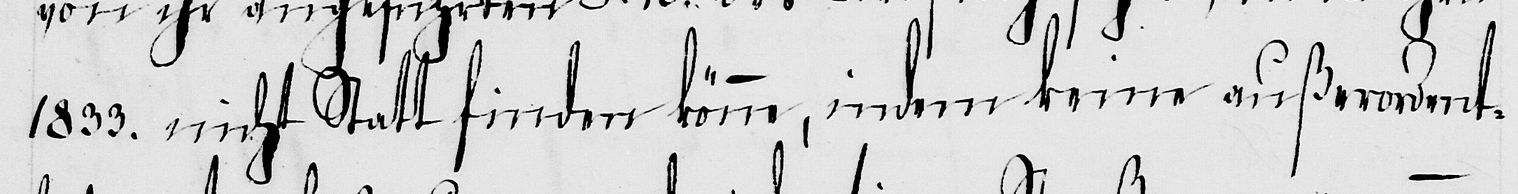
1833. nicht Statt finden könne, indem keine außerordent¬
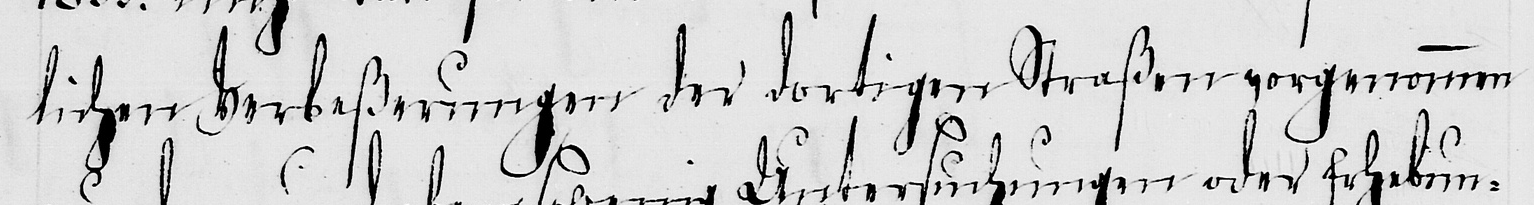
lichen Verbeßerungen der dortigen Straßen vorgenommen
